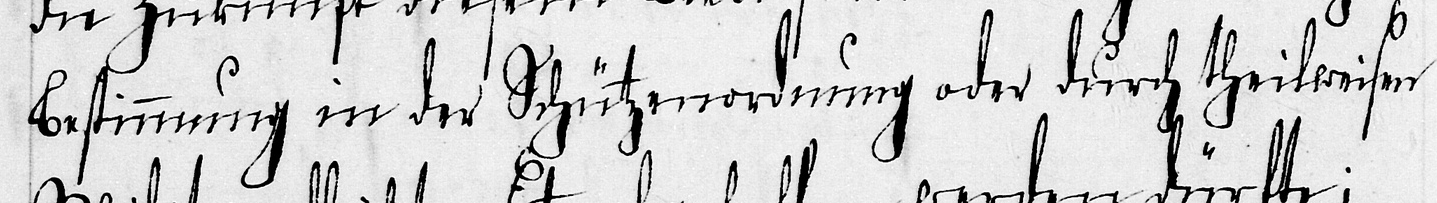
Bestimmung in der Schützenordnung oder durch theilweisen
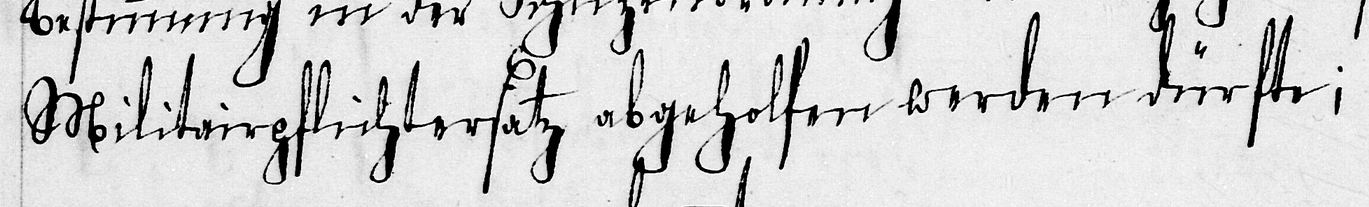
Militairpflichtersatz abgeholfen werden dürfte;
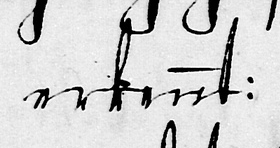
erkennt:
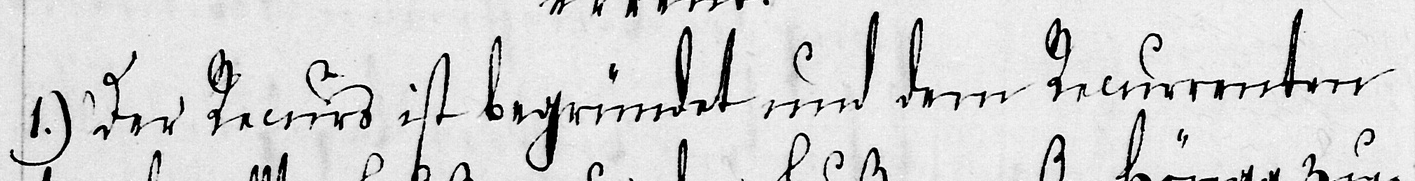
1.) Der Recurs ist begründet und dem Recurrenten
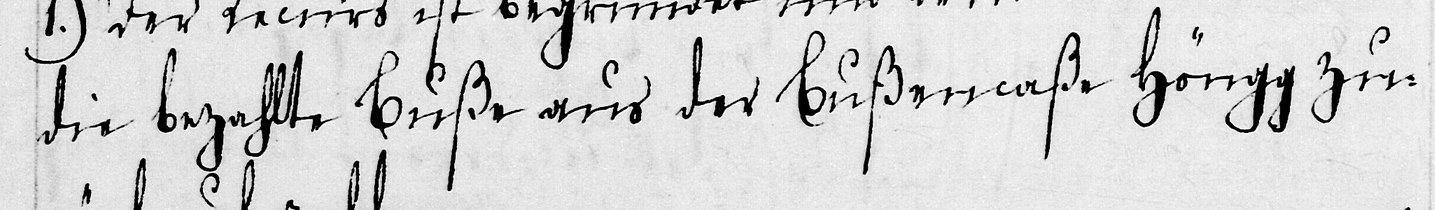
die bezahlte Buße aus der Bußencaße Höngg zu¬
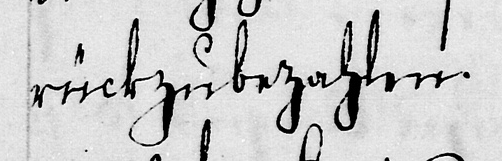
rückzubezahlen.
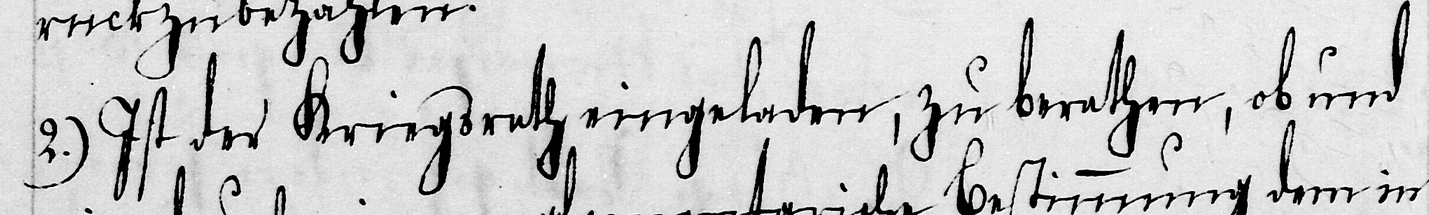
2.) Ist der Kriegsrath eingeladen, zu berathen, ob und
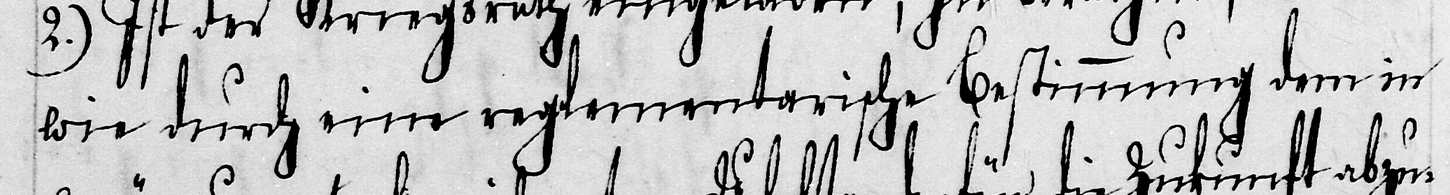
wie durch eine reglementarische Bestimmung dem in
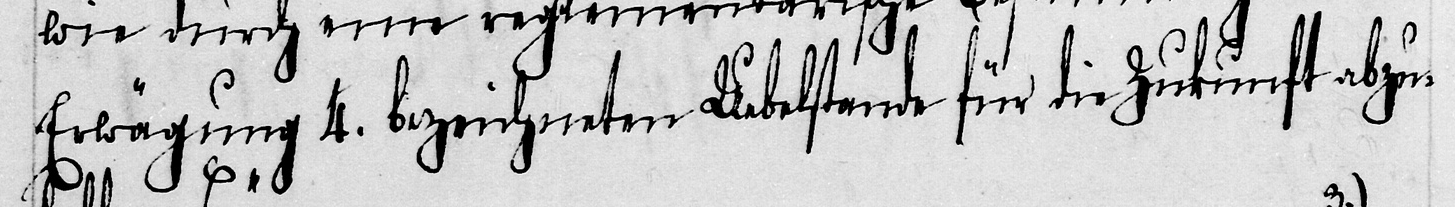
Erwägung 4. bezeichneten Uebelstande für die Zukunft abzu¬
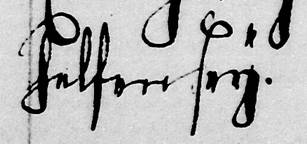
helfen sey.
